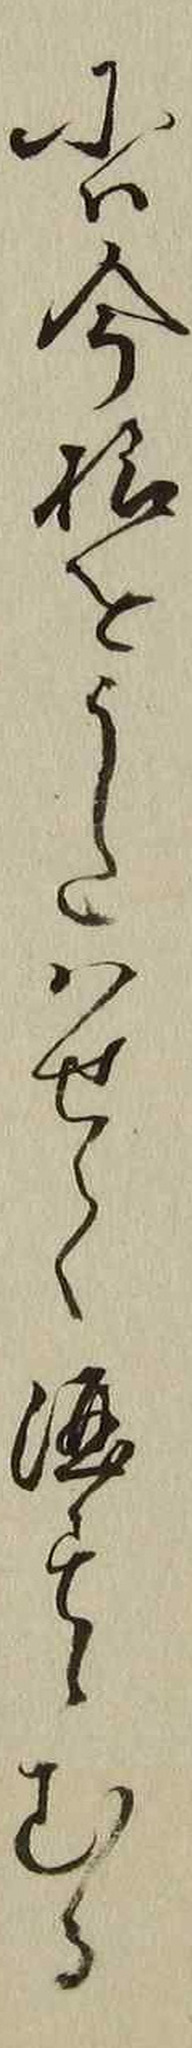にハ今様をうたはせて酒すゝむる
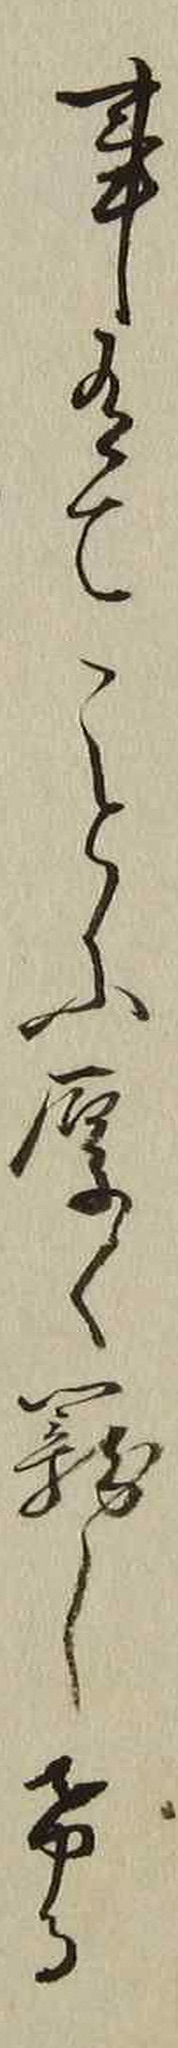事有てことに厚く寵しける
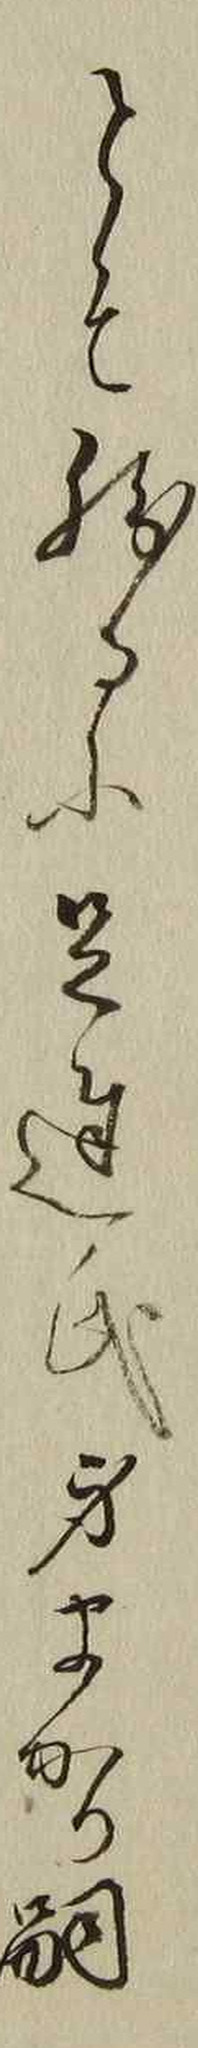とそ然るに足達氏身まかり嗣
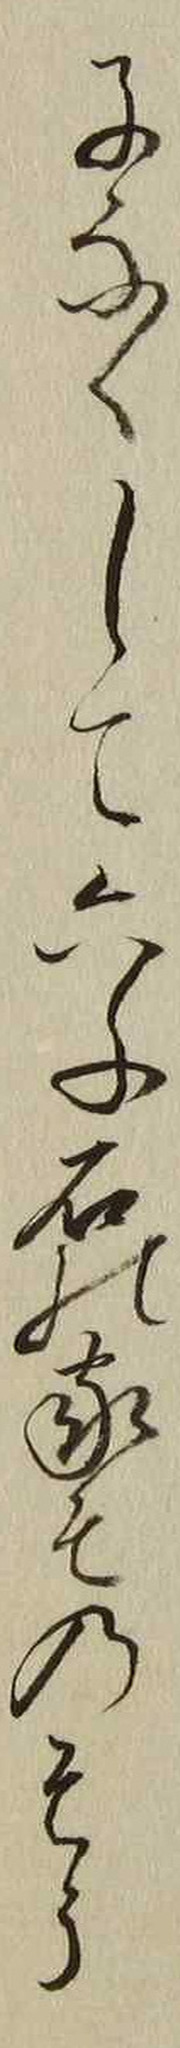子なくして六千石の家そのそう
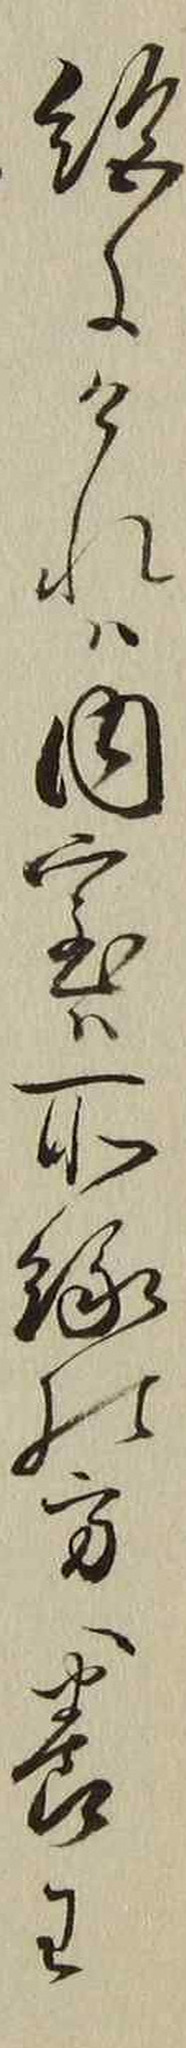絶にけれハ内室ハ所縁の方ヘ養わ
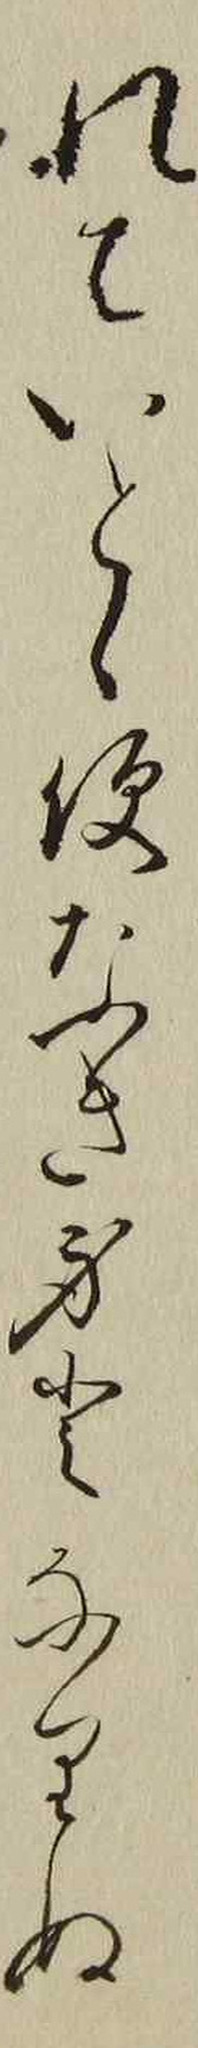れていとゝ便なき身となりぬ
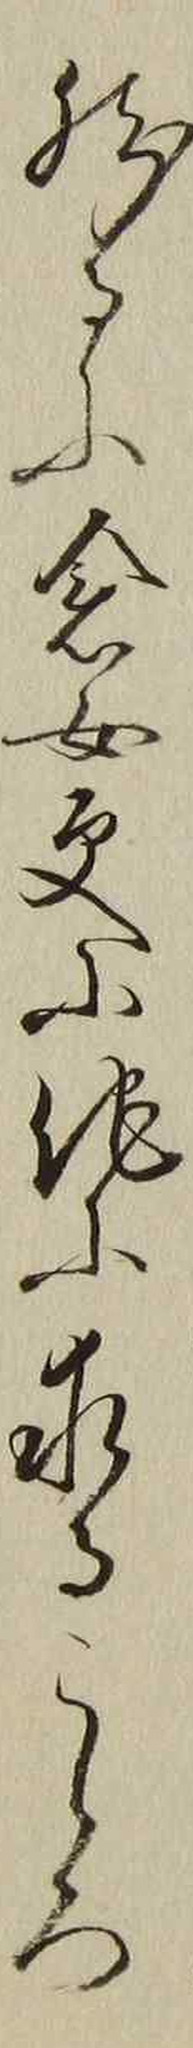然るに倉女更に他に求るこゝろ
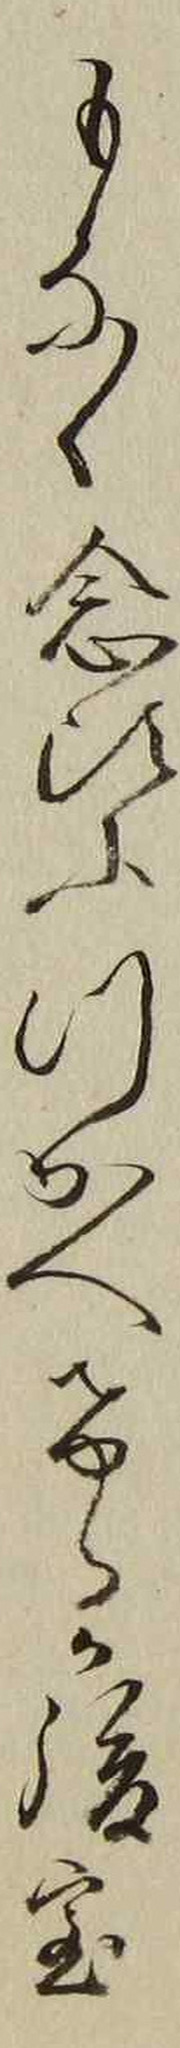もなく念頃につかへけるか後室
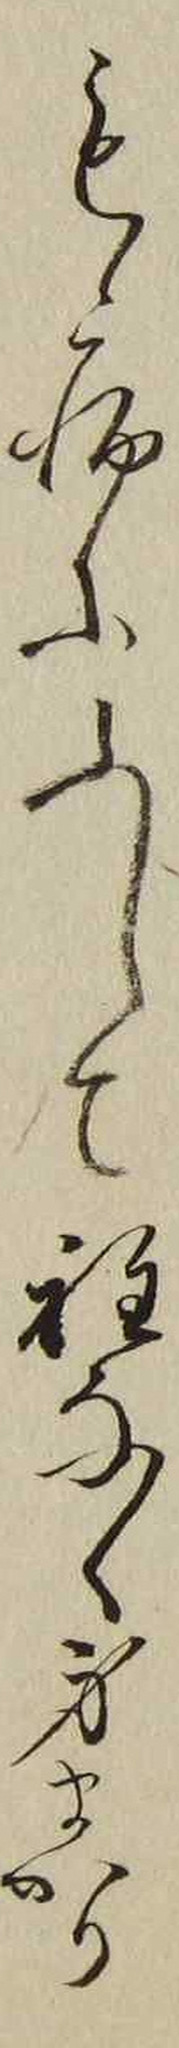も病にふして程なく身まかり
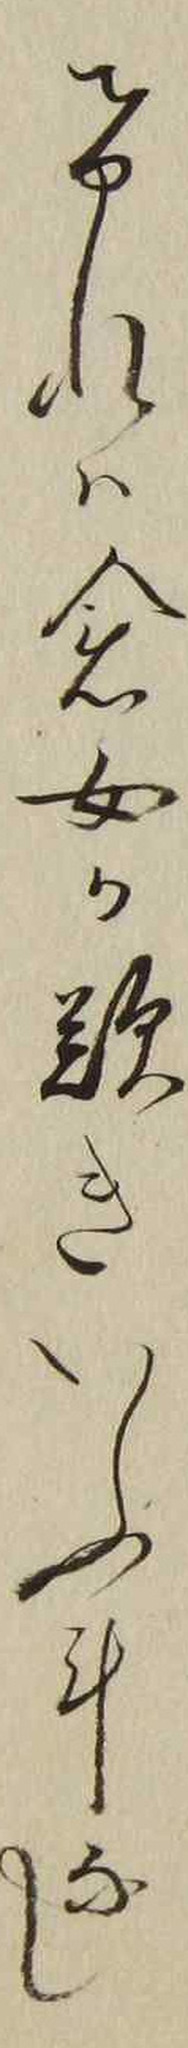けれハ倉女か歎きいふ斗なし
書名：諸士系譜　巻之12　い之部12
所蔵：会津若松市立会津図書館
